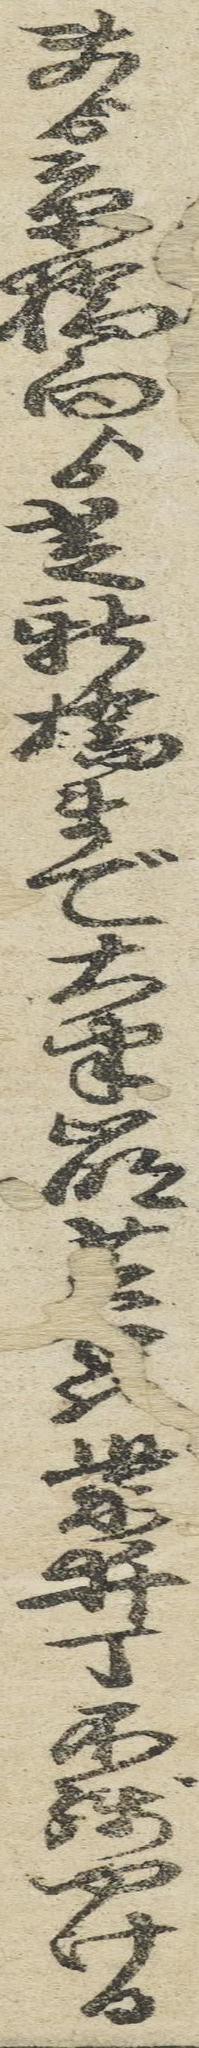夫ゟ京橋向ゟ芝新橋まで大半崩芝柴井丁不残やける
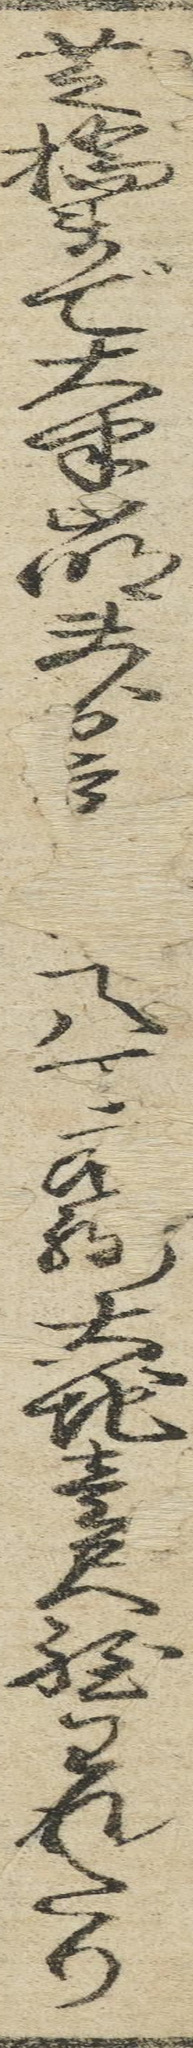芝橋まで大半崩夫ゟハ丁不残大地壱尺程われたり
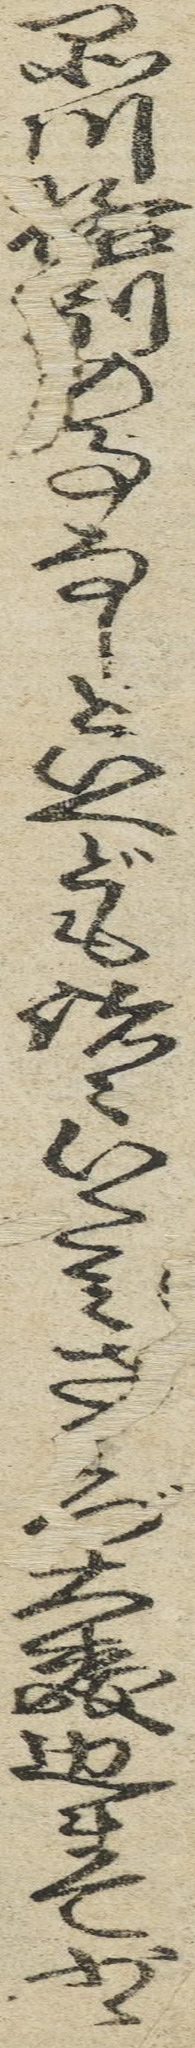品川格別の事なしといへども諸〻いたみさづ大森辺まて少〻
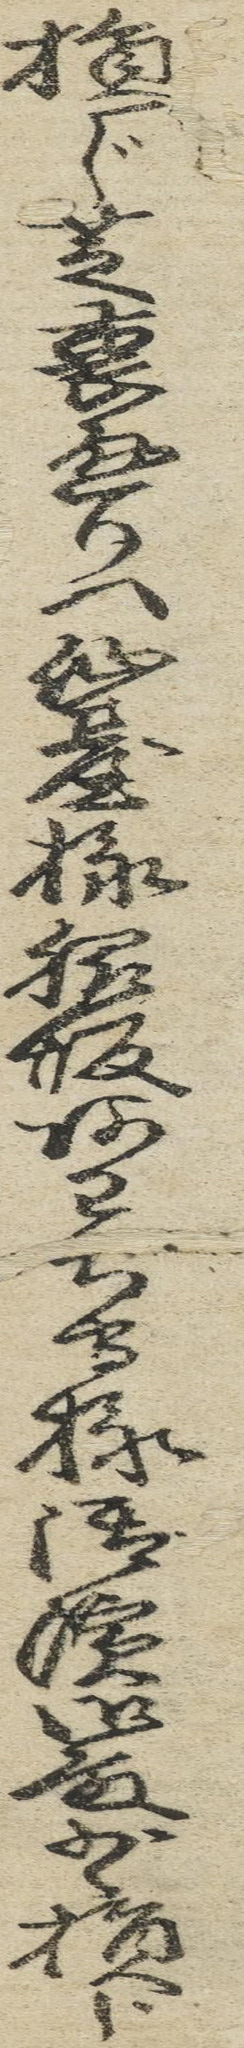損じ芝裏通りハ仙台様脇坂あわぢ守様御浜御殿少〻損じ
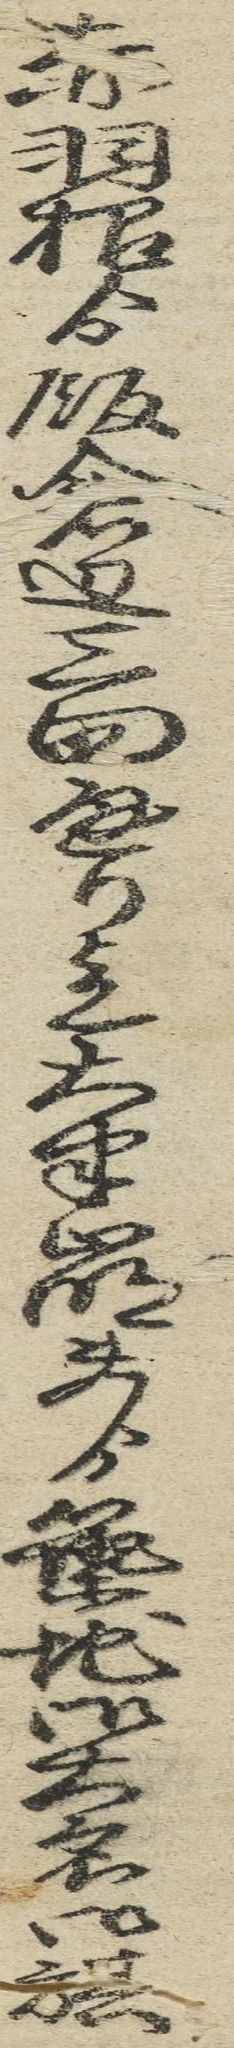赤羽根ゟ飯倉辺三田通り迄大半崩夫ゟ築地御大名御旗
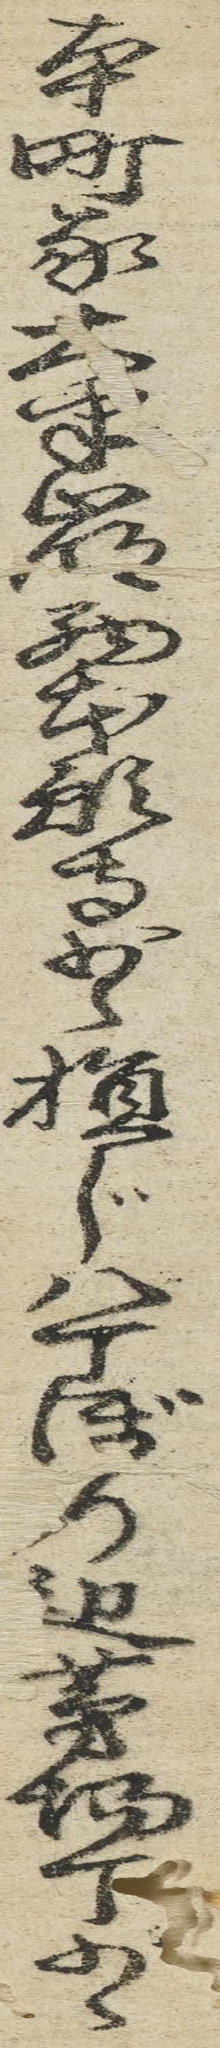本町家大半崩西本願寺少〻損じ八丁ぼり辺茅場丁少〻
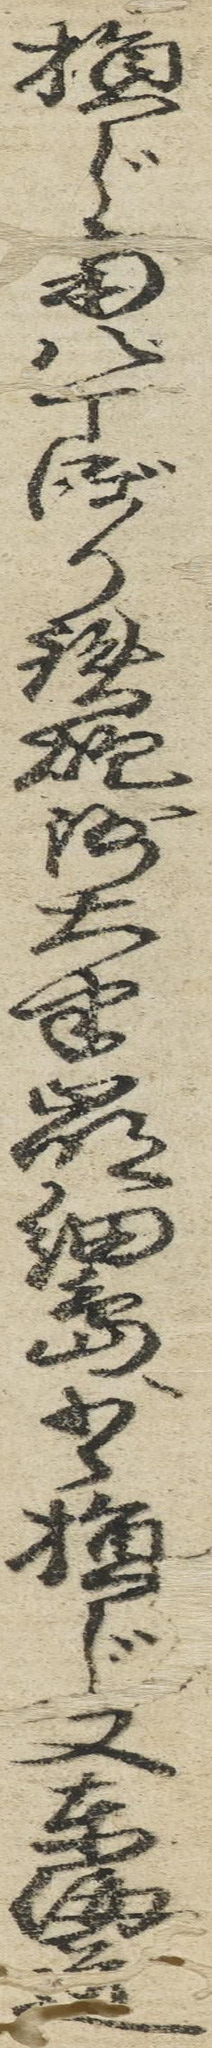損じ南八丁ぼり鉄砲洲大半崩細島少〻損じ又東海道
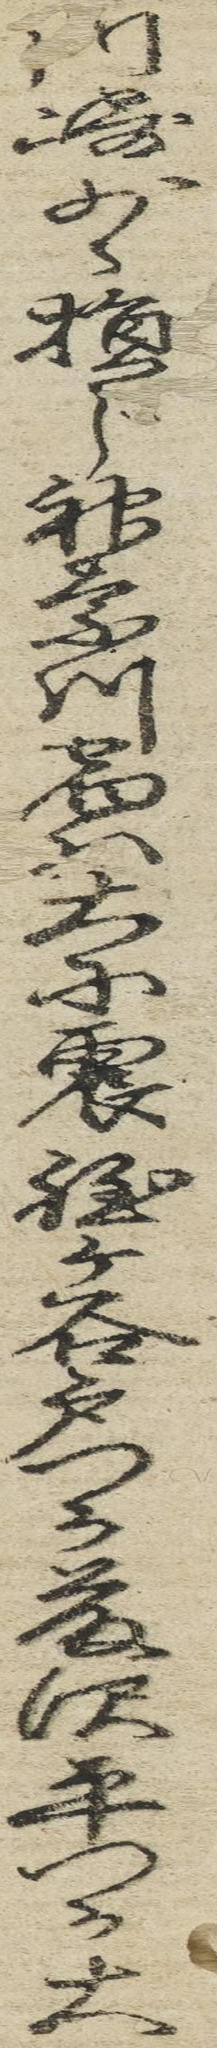川崎少〻損じ神奈川宿ハ大に震程ヶ谷戸つか藤沢平つか大
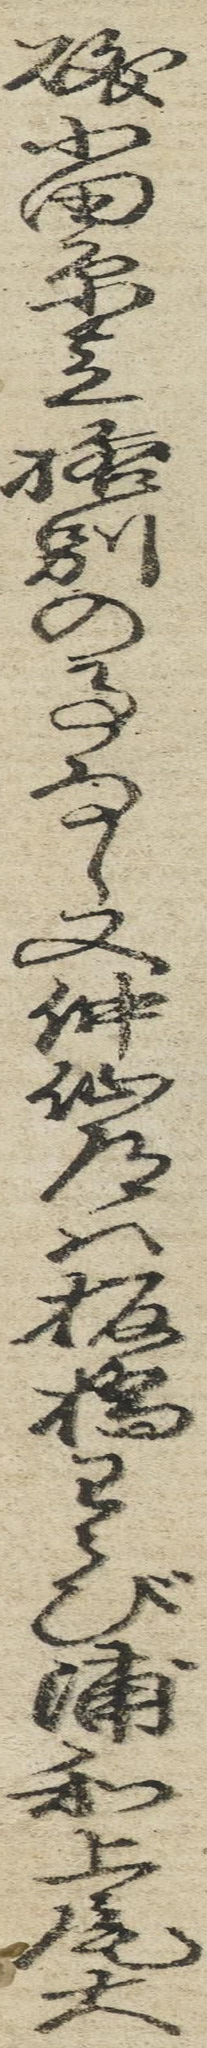磯小田原迄格別の事なし又仲仙道ハ板橋わらび浦和上尾大
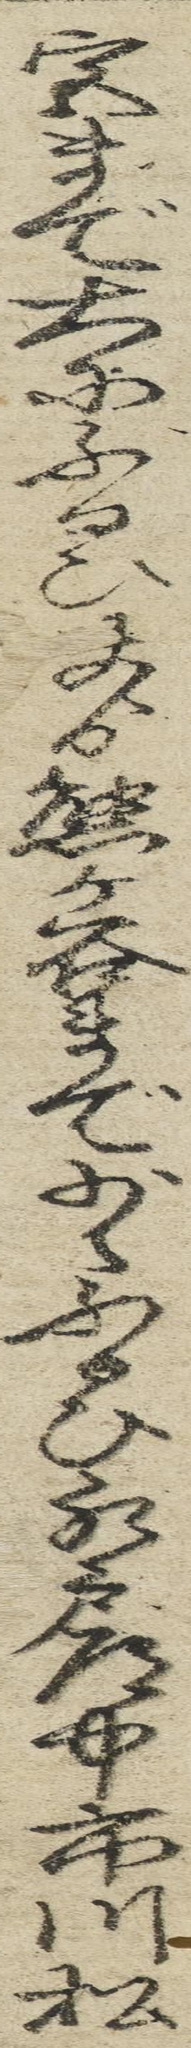宮まで大にふるひ夫ゟ熊ヶ谷まで少〻ふるひ水戸道中市川松
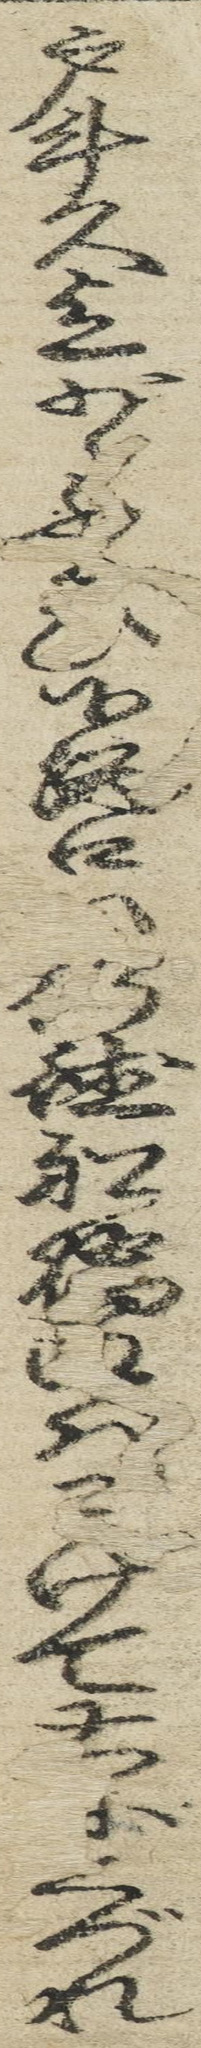戸牛久迄少〻ふるひ下総口ハ行徳舩橋ハさ？けて大にくづれ
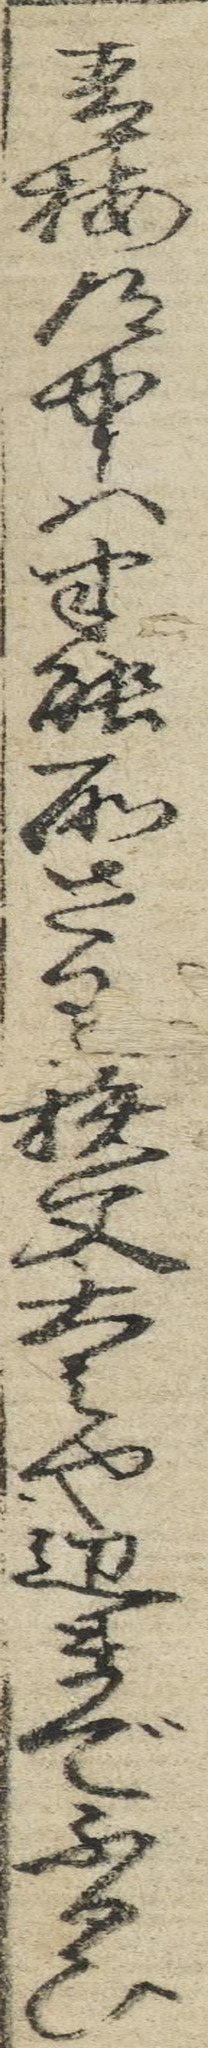青梅道中ハ半能所さわ秩父大みや辺までふるひ

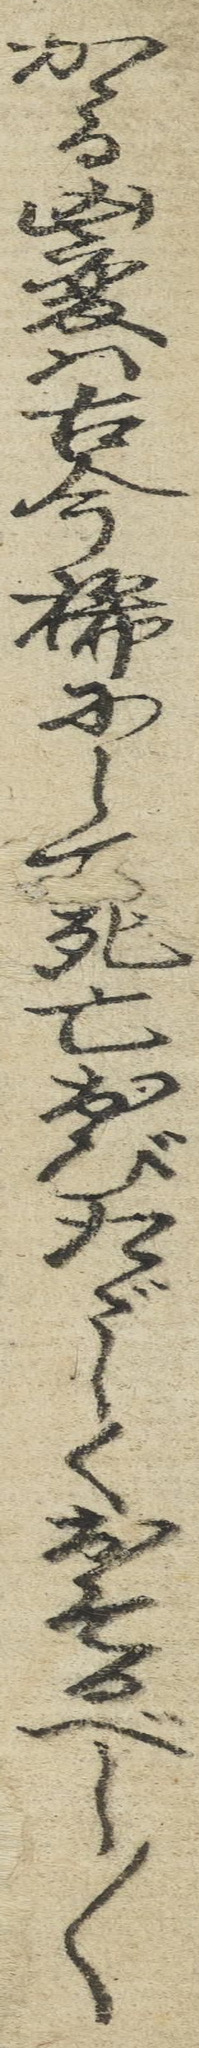かかる凶変は古今稀にして死亡おびただしくおそるべし〳〵
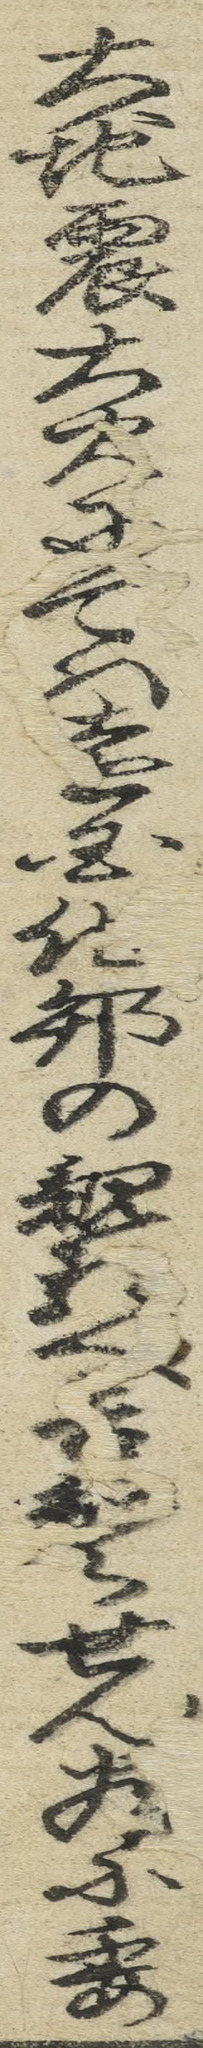大地震大火にては遠国他邦の親類へ告？知らせん為に委
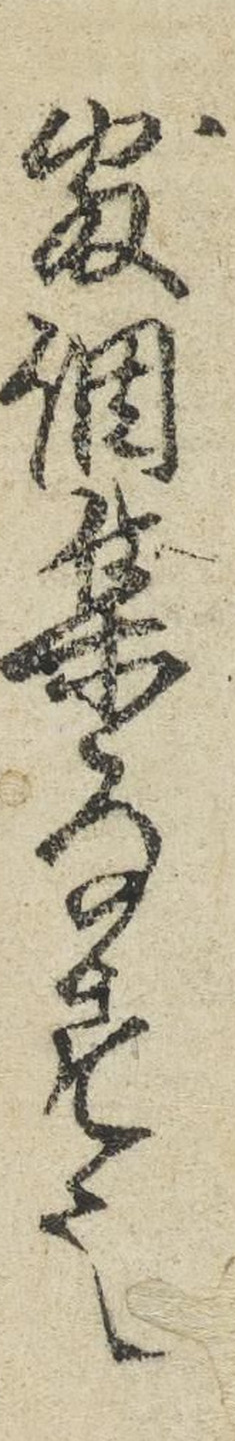敷調集なす也
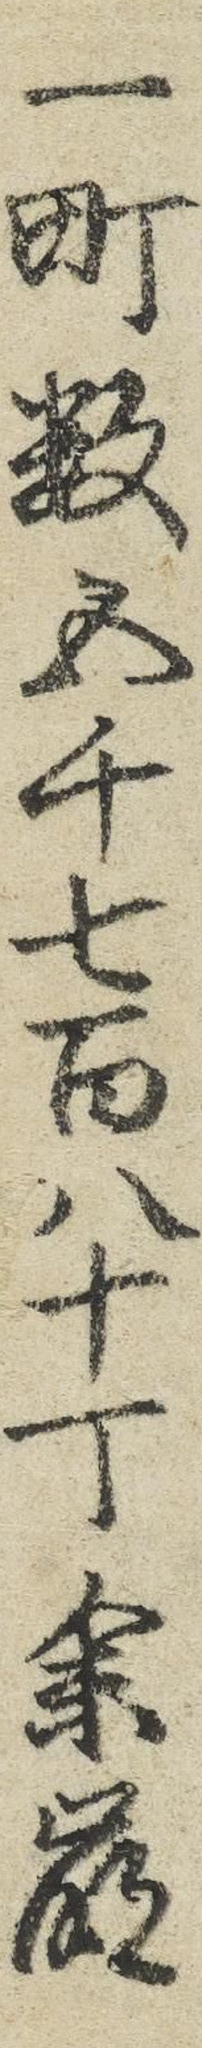一町数五千七百八十丁余崩
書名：関東五街道　江戸大地震出火場所
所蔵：東京大学地震研究所図書室 Earthquake Research Institute Library, The University of Tokyo, JAPAN
